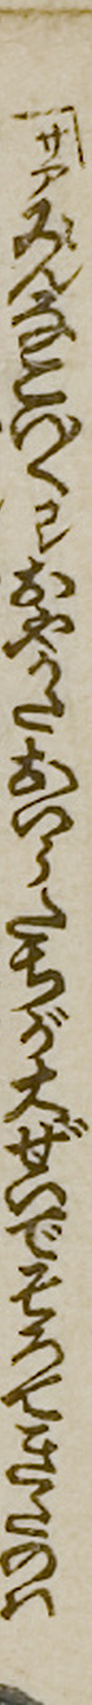「さあみんなこい〳〵これおやかたおいらたちが大ぜいでそろてきたのは
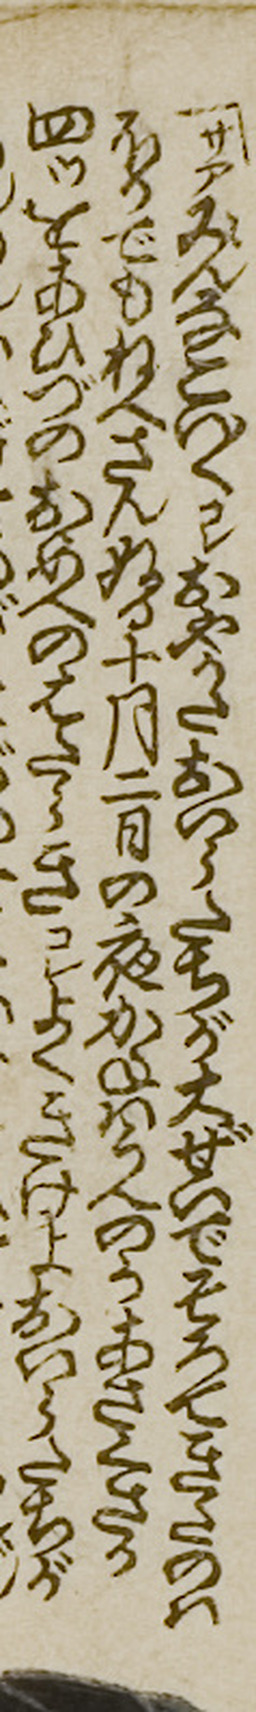ほかでもねへさんぬる十月二日の夜かねはうえのかあさくさか
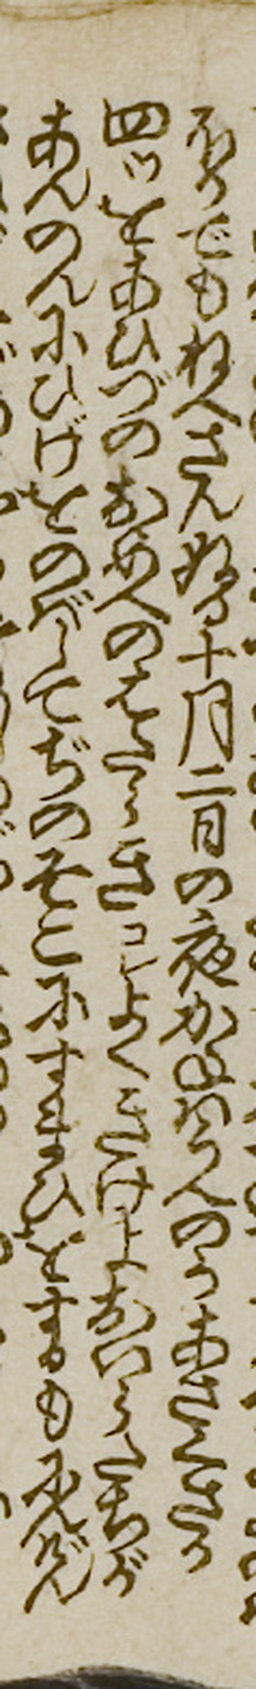四つをあひづのおめへのはたらきこれよくきけよおいらたちが
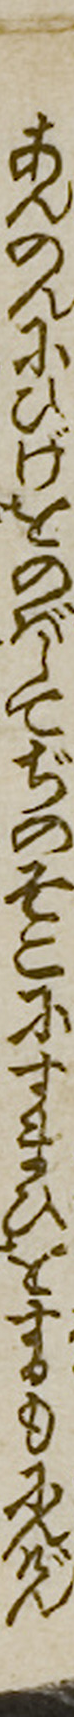あんのんにひげをのばしてぢのそこにすまひをするもにんげん
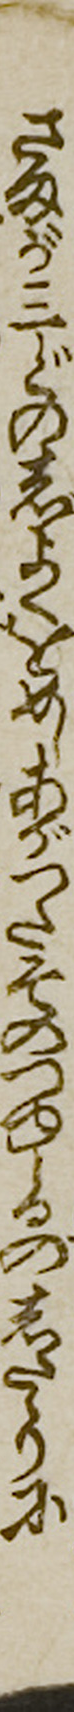さまが三どのしよくをめしあがつたそのつゆしるのしたゝりに
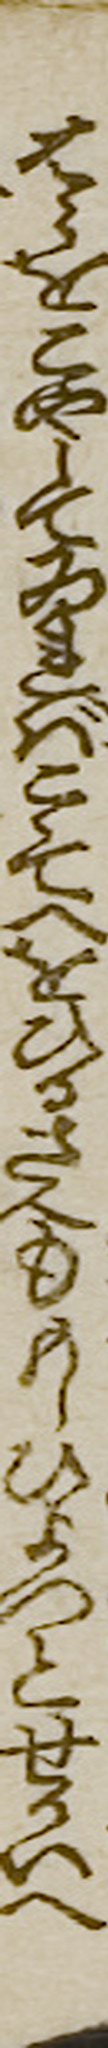はらをこやしてゐればこそへをひるさへももしひよつとせかいへ
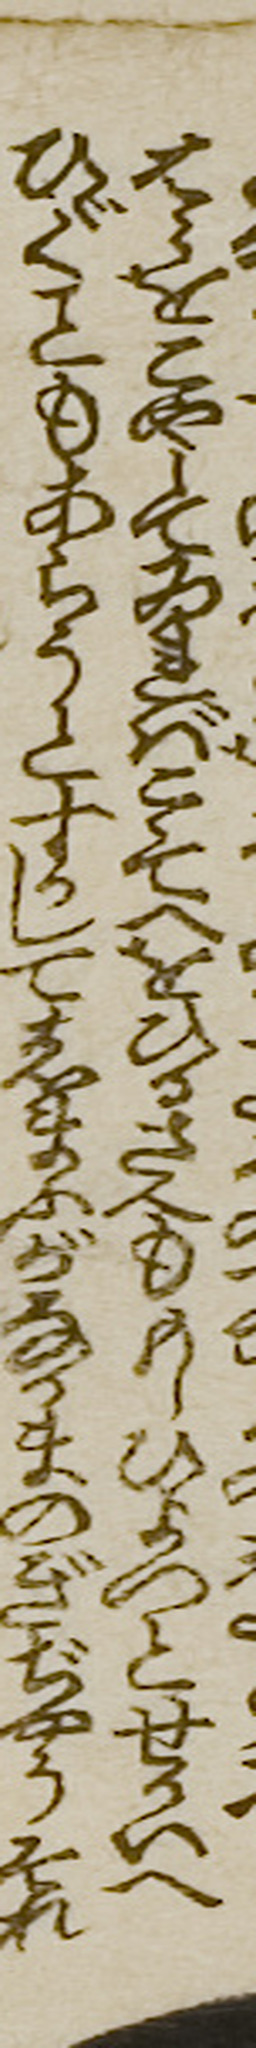ひゞくこともあらうかとすかしてしまふがなかまのぎぢやうそれ
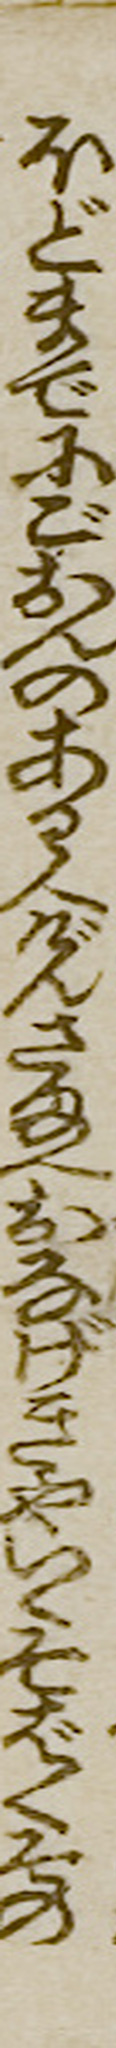ほどまでにごおんのある人げんさまへおなげきやいくそばくその
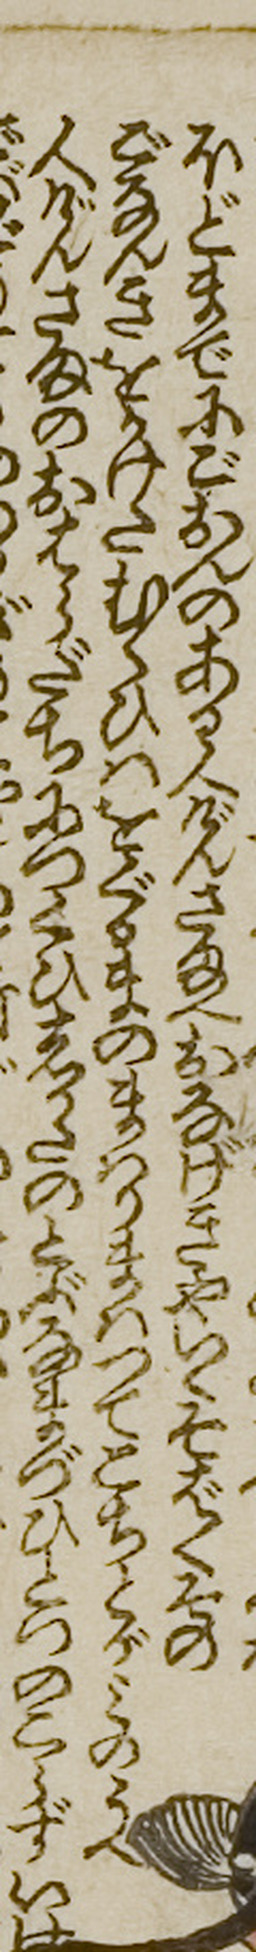ごなんきをうけたむくひはをぐるまのまわりまはつてこちらがみのうへ
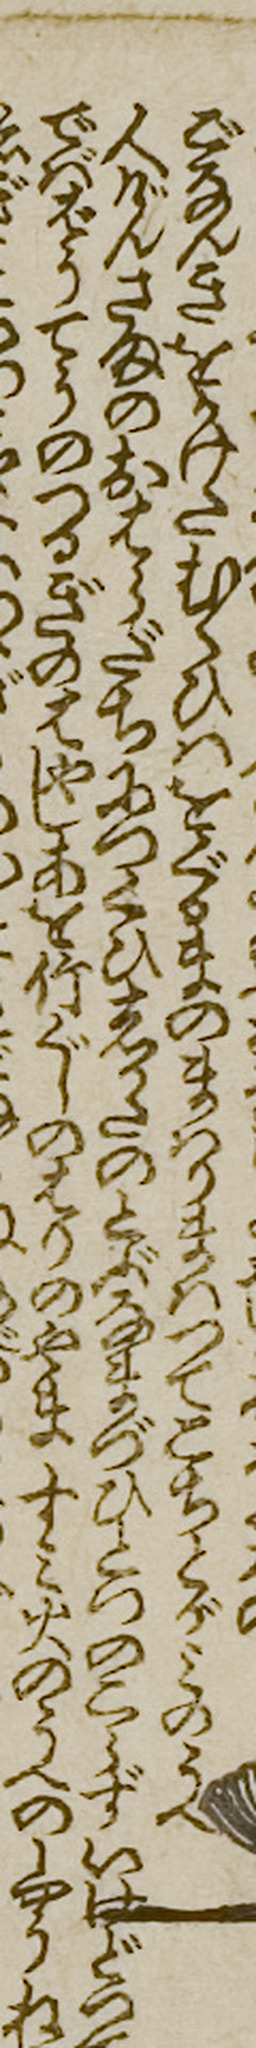人げんさまのおはらだちにつたひしかたのとぶなまづひとつのこらずいけどつて
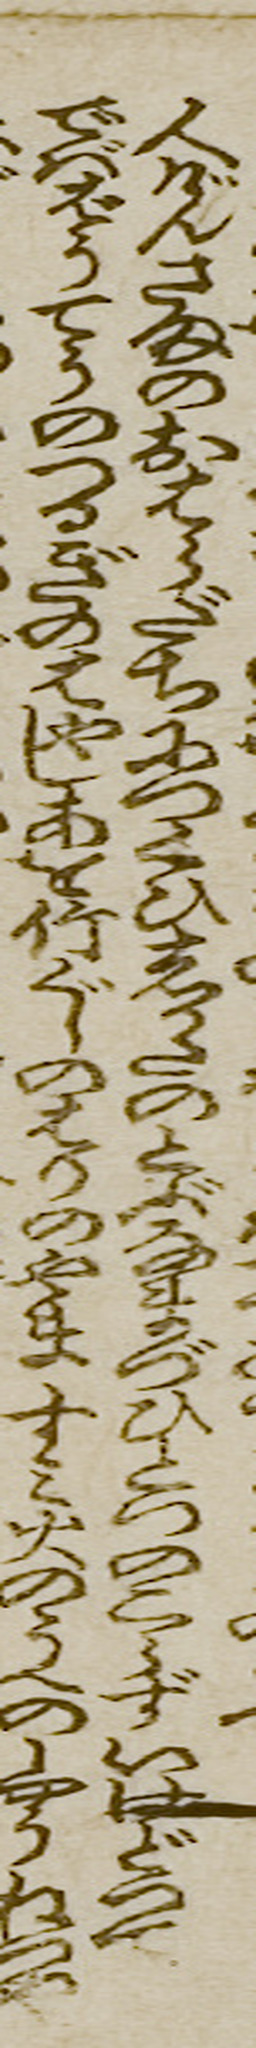でばばうてうのつるぎのはやしあを竹ぐしのはりのやますみ火のうへのしやうねつや
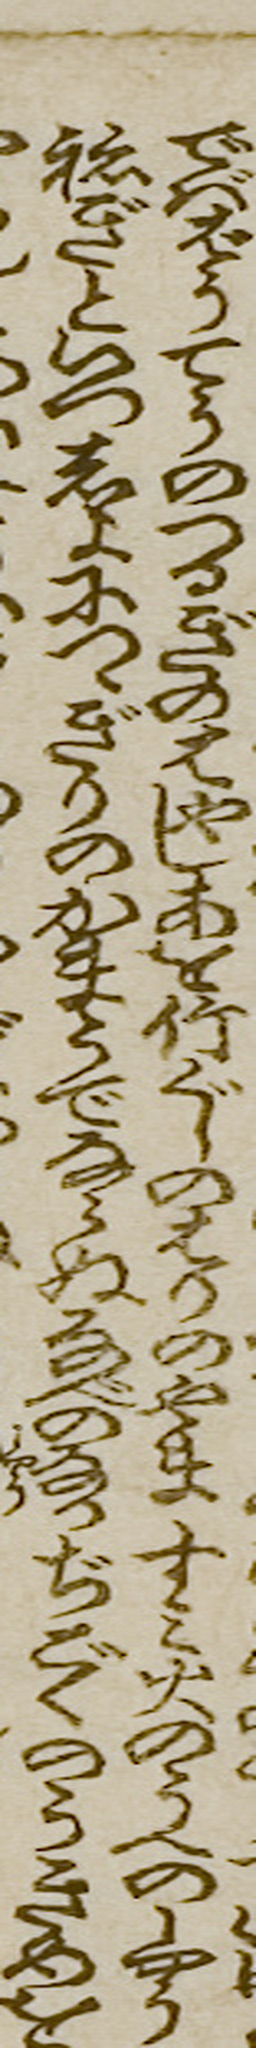ねぎといつしよにつゝぎりのかまどでならぬなべのなかぢごくのうきめをみせ
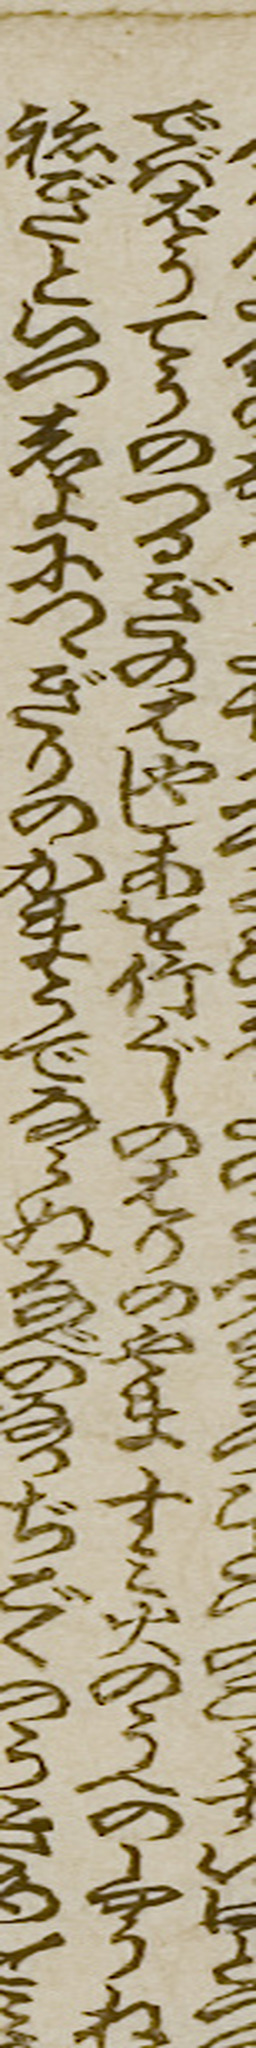ねぎといつしよにつゝぎりのかまどでならぬなべのなかぢごくのうきめをみせ
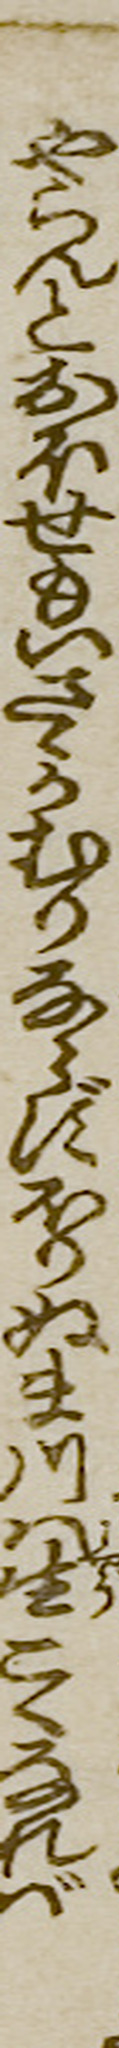やらんとおほせもいたくかむりならずほりぬま川は生こくなれば
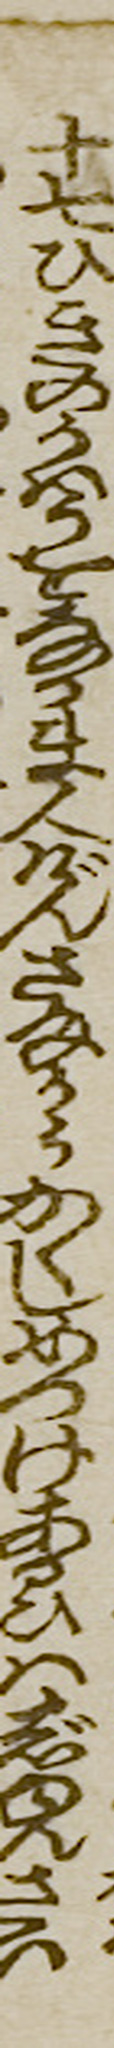十七ひきのかわうをなかま人げんさまからかくしめつけあるひはじゆんさい
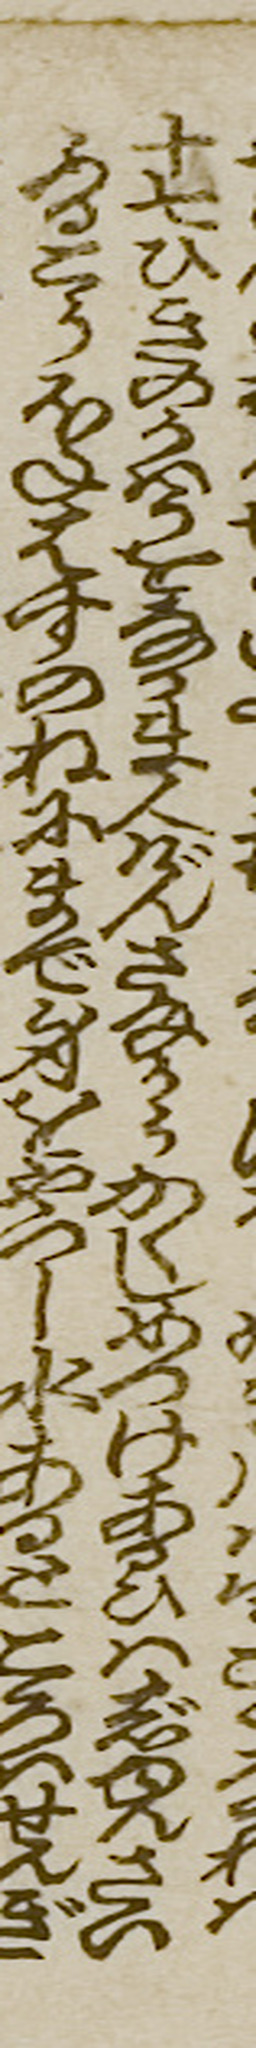ふるごうほねはすのねにまで身をやつし水あるところはせんぎ
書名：万歳楽鯰の後悔
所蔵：東京大学総合図書館 General Library in the University of Tokyo, JAPAN
